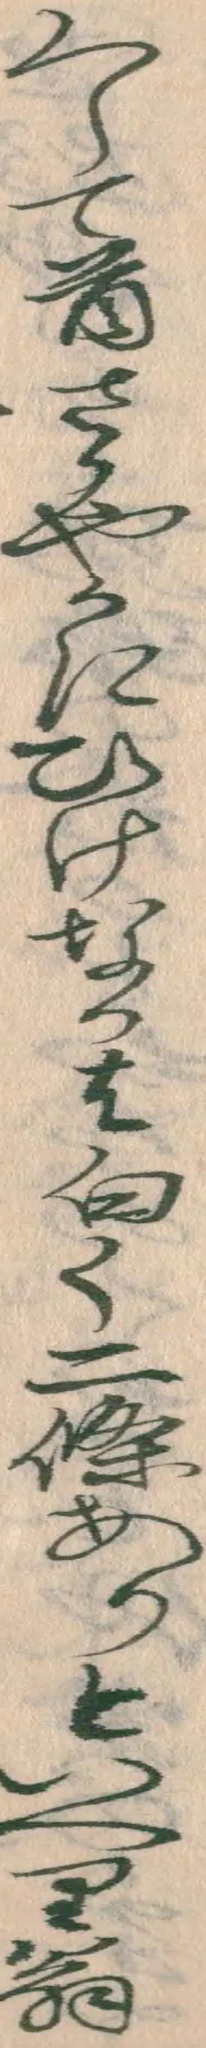くして首さゝやかにひけなかは白く二條ありとへり翁
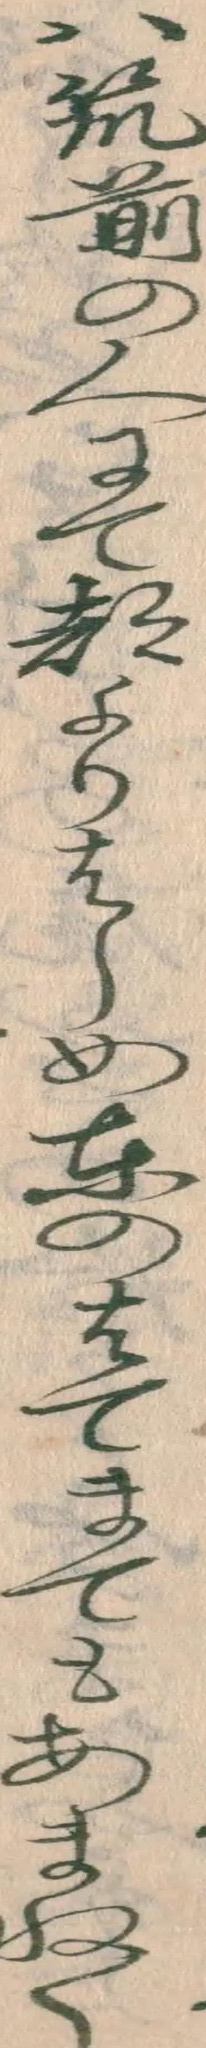は筑前の人にて都よりはしめ東のはてまてもあまねく
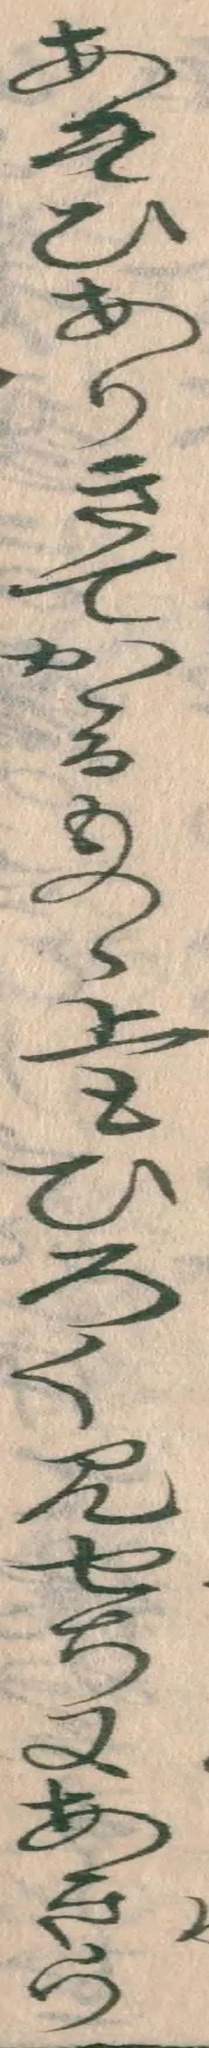あそひありきてかゝるものゝ上もひろく見せちにあきら
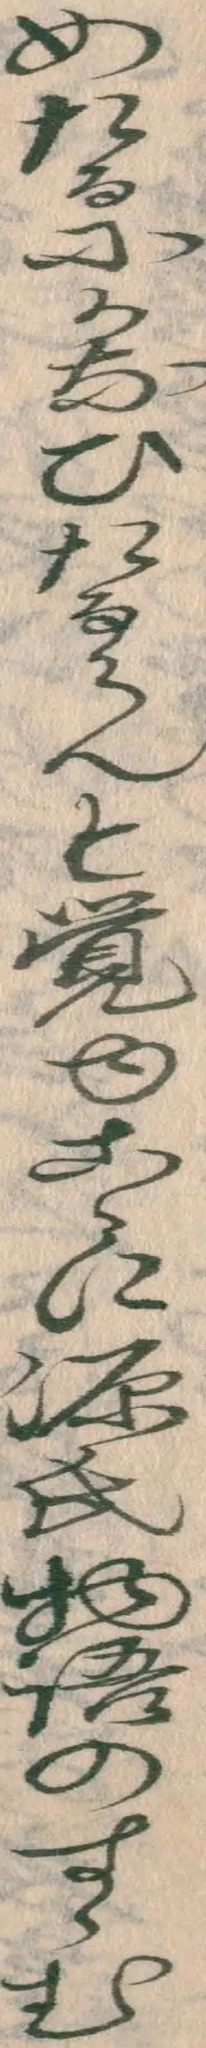めたるにかなひたるらんと覚ゆこゝに源氏物語のすゝむ
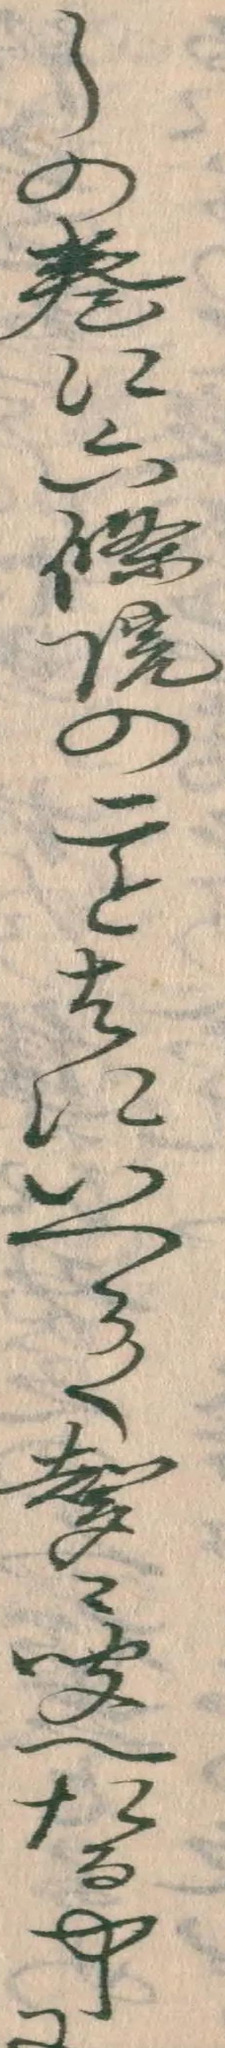しの巻に六條院のことはにいへらく聲々聞へたる中に
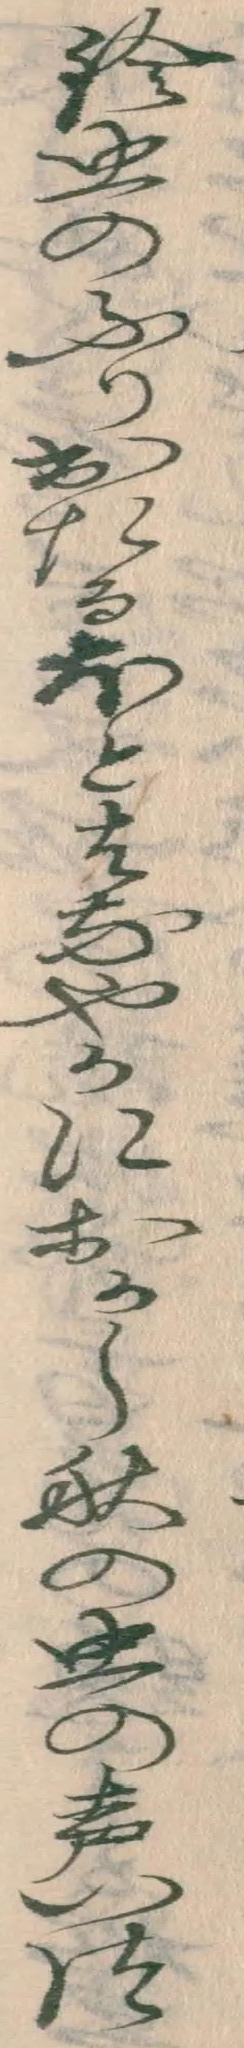鈴虫のふり出たるほとはなやかにおかし秋の虫の声いつ
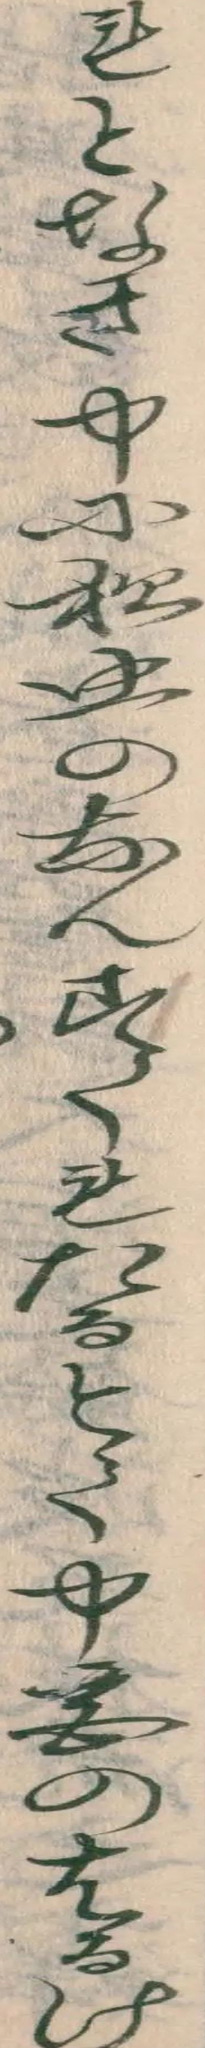れとなき中に松虫のなんすくれたるとて中宮のはるけ
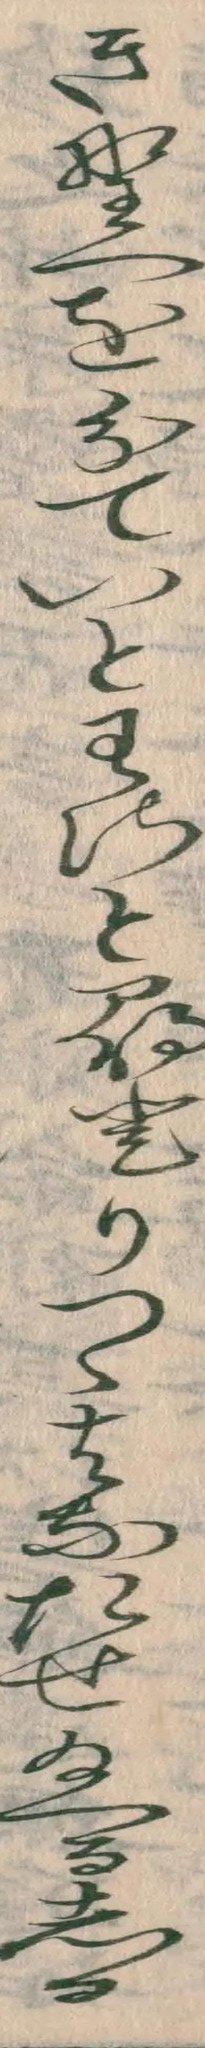き野へを分ていとわさと尋とりつゝはなたせ給へるしる
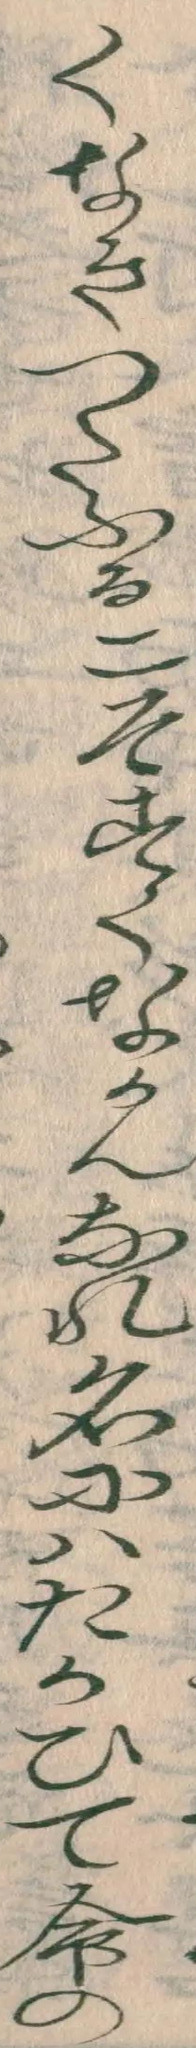くなきつたふるこそすくなかんなれ名にはたかひて命の
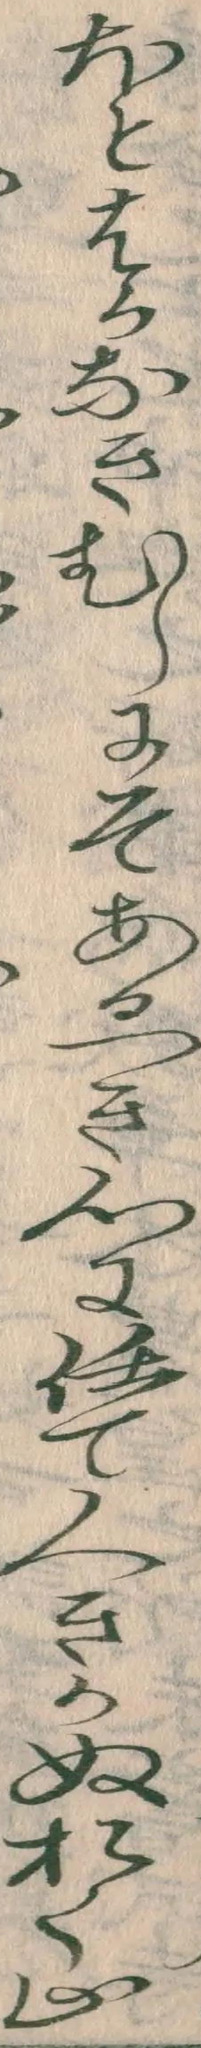ほとはかなきむしにそあるへき心に任て人きかぬおく山
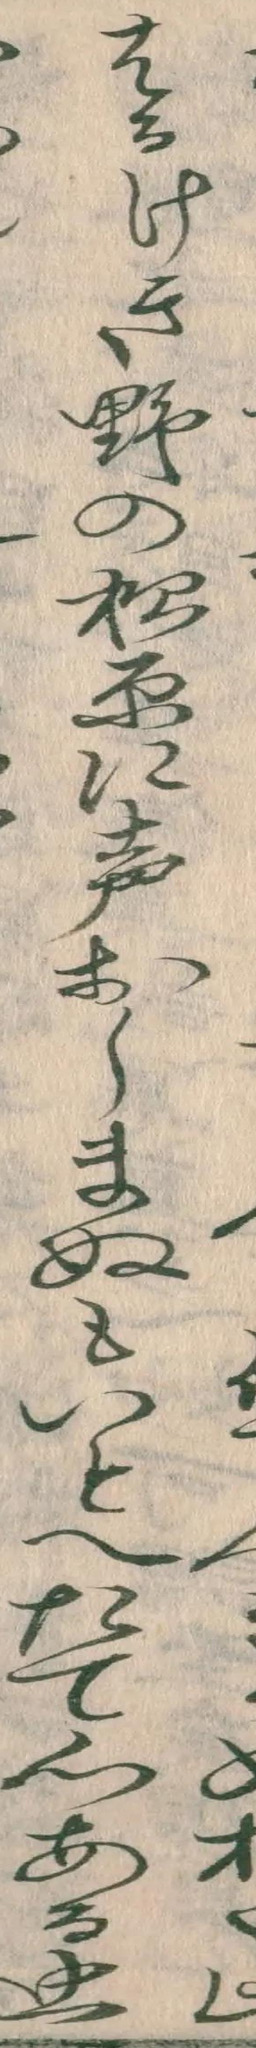はるけき野の松原に声おしまぬもいとへたて心ある虫
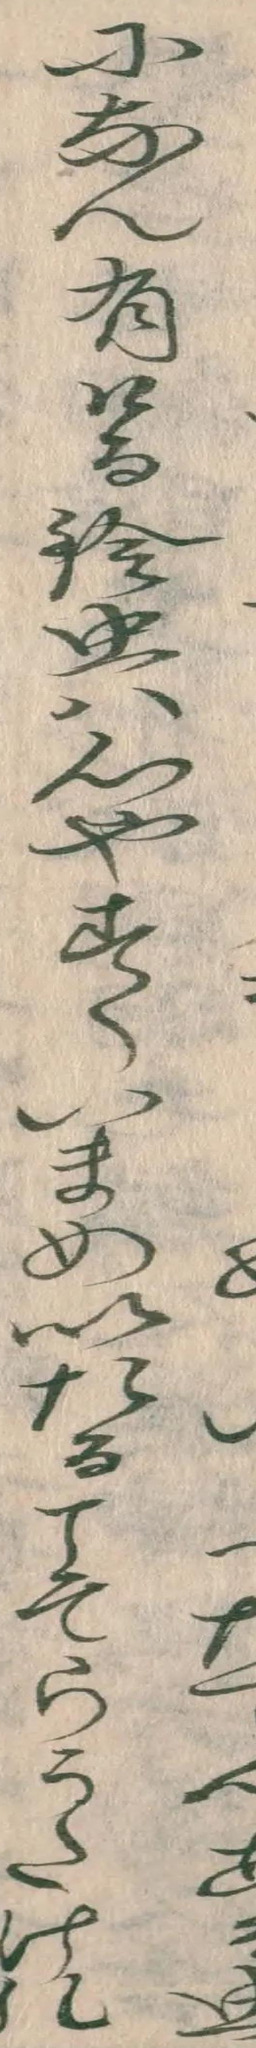になん有ける鈴虫は心やすくいまめいたるこそらうたけれ
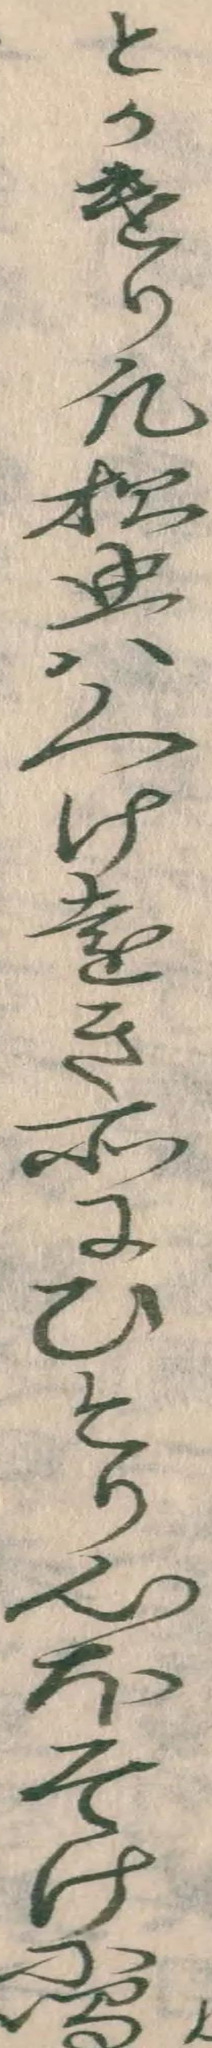とかけり凡松虫は人け遠き所にひとり心ほそけに鳴
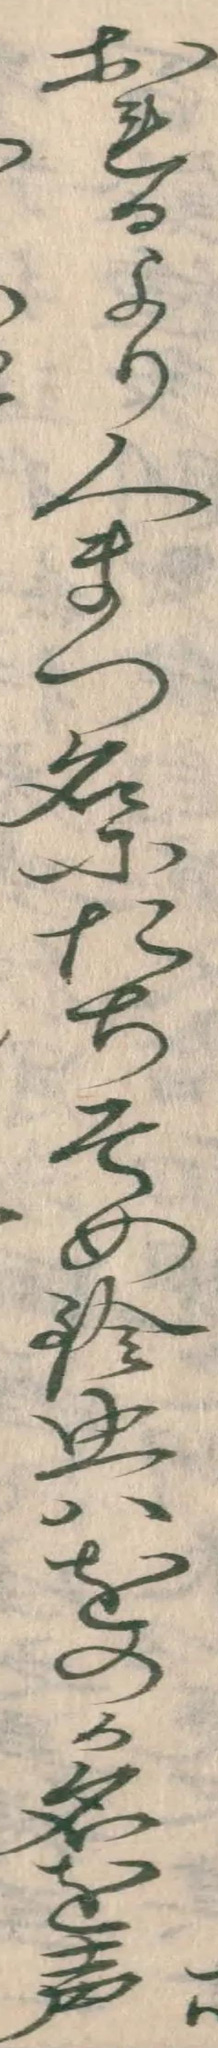おれるより人まつ名にたちそめ鈴虫はをのか名を声
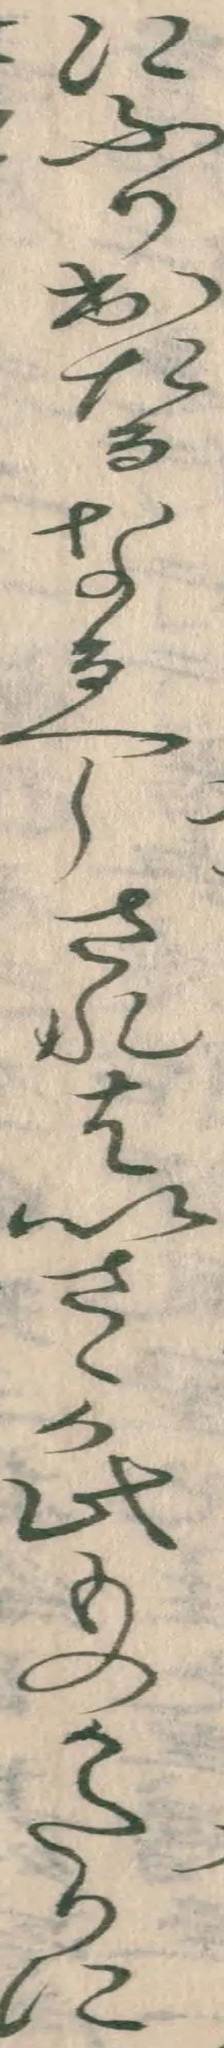にふり出たるなるへしされはいさゝか此ものかたりに
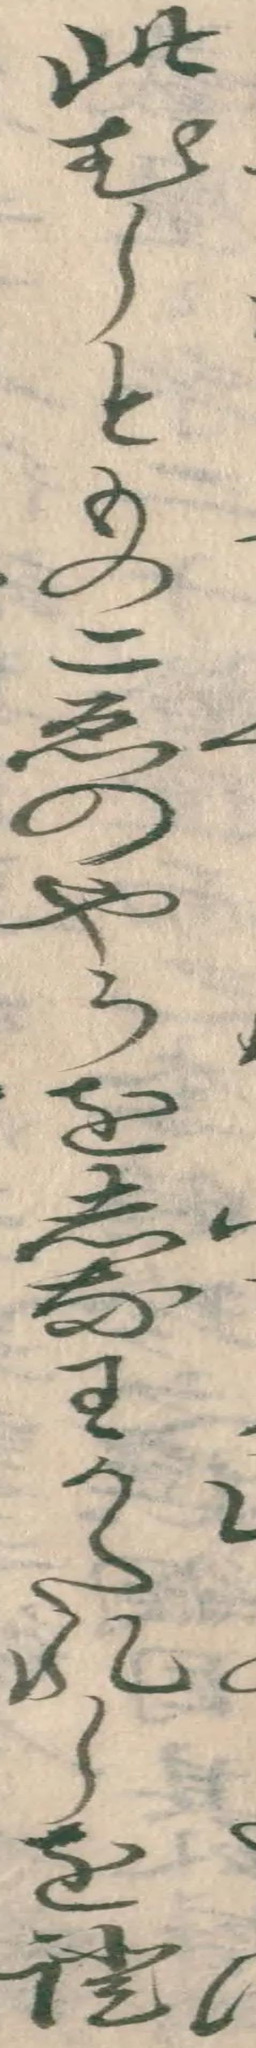此むしとものこゑのやうをしなわかたれしを証
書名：千蟲譜 3巻. [3]
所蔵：国立国会図書館 National Diet Library, JAPAN
